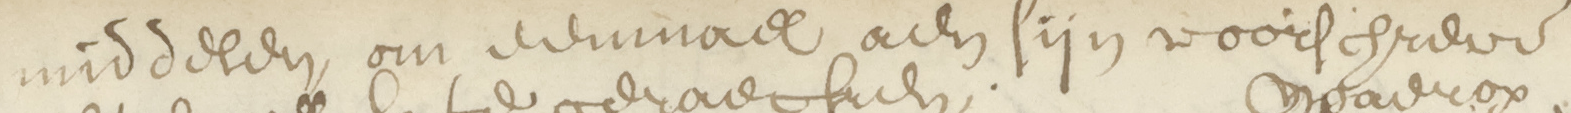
middelen, om eenmael aen sijn voorschreve
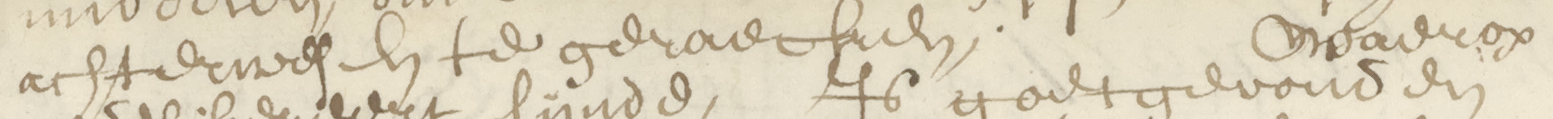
achterwesen te geraecken; Waerop
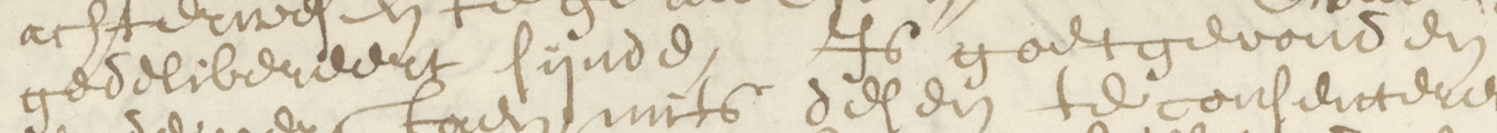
gedelibereert sijnde, Is goetgevonden
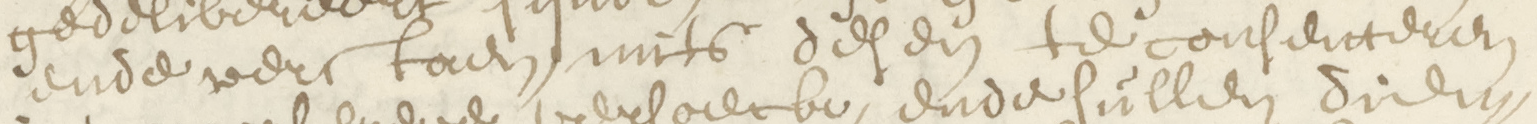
ende verstaen, mits desen te consenteren
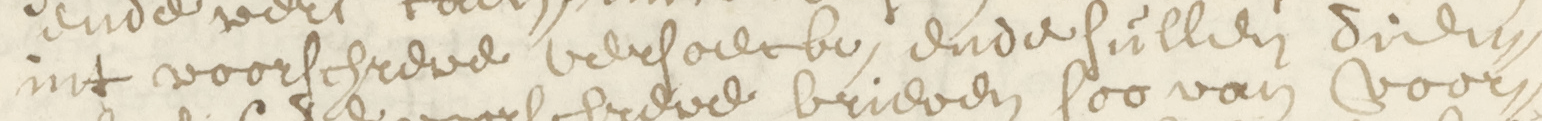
int voorschreve versoeck, ende sullen dien„
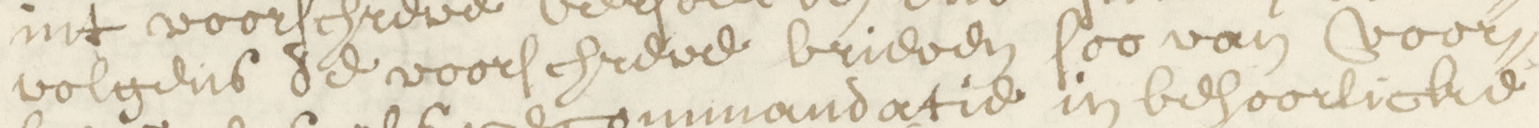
volgens de voorschreve brieven soo van voor„
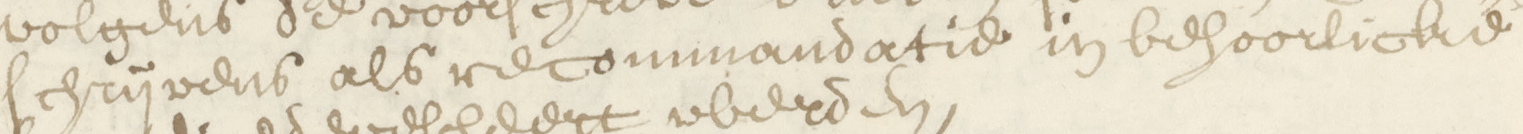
schrijvens als recommandatie in behoorlicke
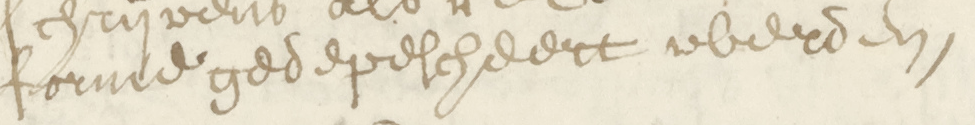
forme gedepescheert werden.
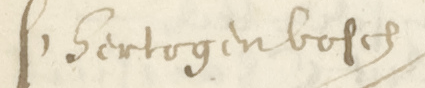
s‛hertogenbosch
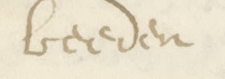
beeden
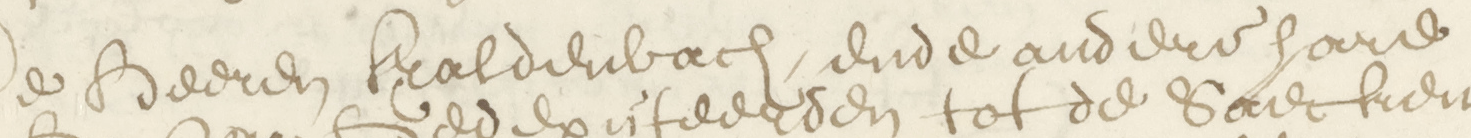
De Heeren Kaldenbach, ende andere hare
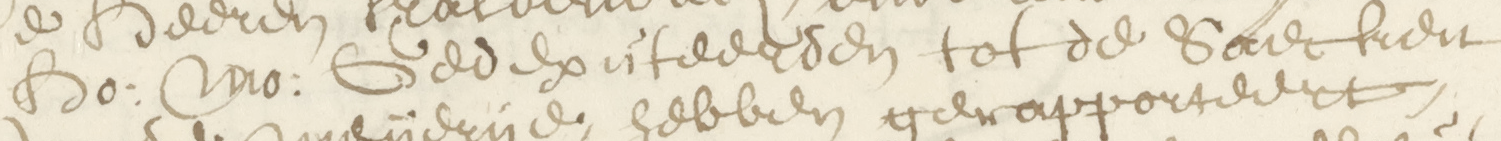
Ho:Mo: Gedeputeerden tot de Saecken
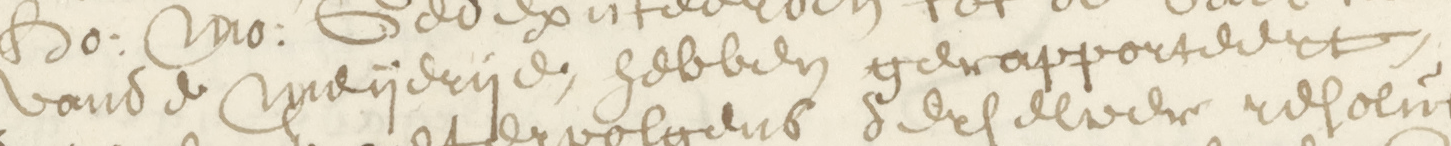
vande meijerije, hebben gerapporteert,
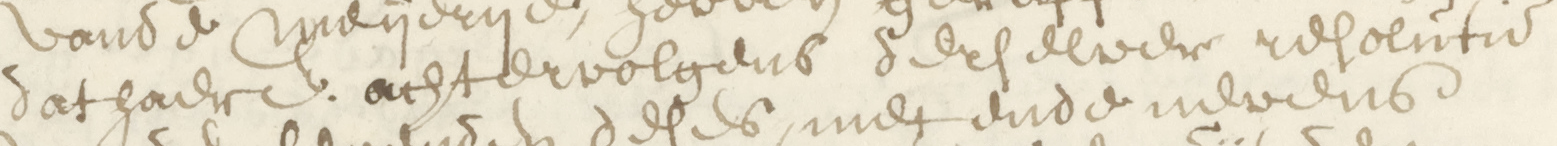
dat haer E. achtervolgens derselver resolutie
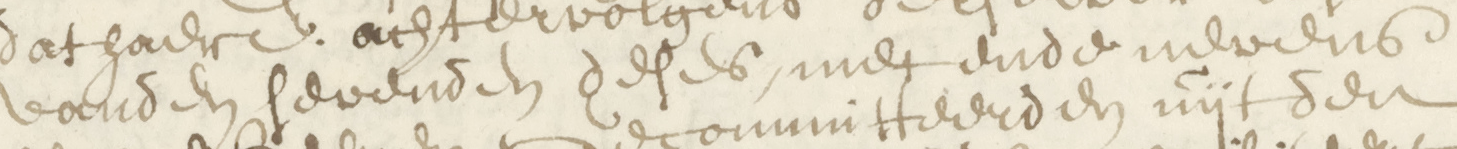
vanden sevenden deses, met ende nevens
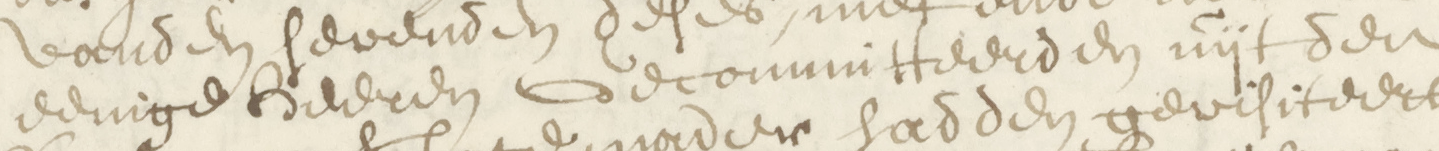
eenige Heeren Gecommitteerden uijt den
